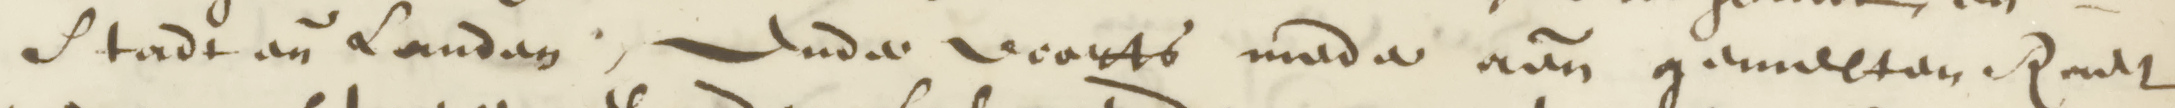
Stadt en Landen, ende voorts mede aen gemelten Raet
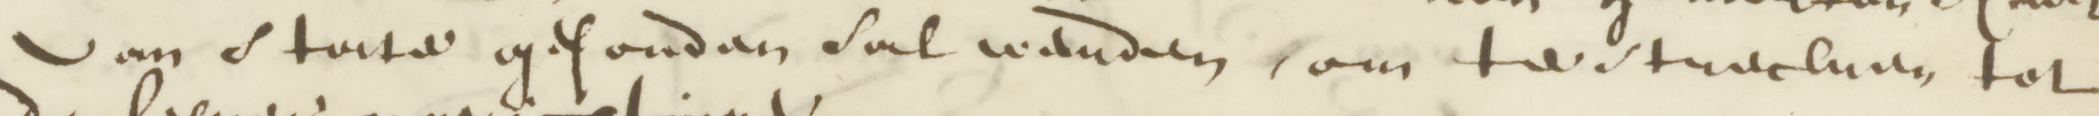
van State gesonden sal werden, om te strecken tot
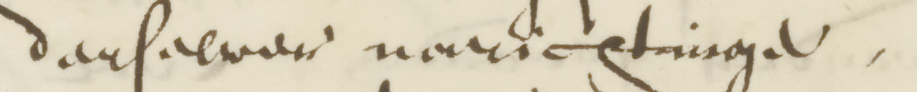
derselver narichtinge.
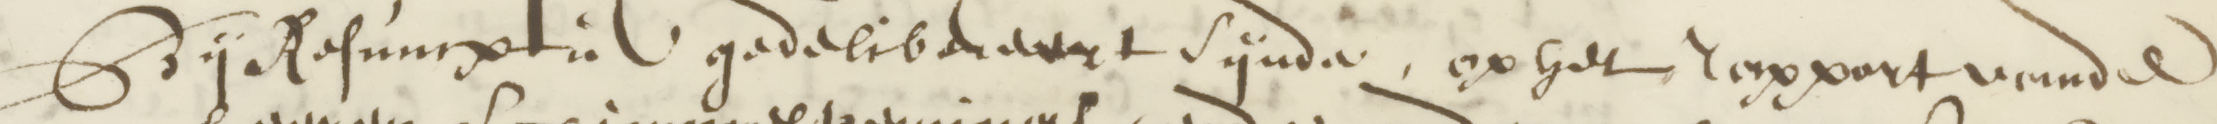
Bij Resumptie gedelibereert sijnde, op het rapport vande
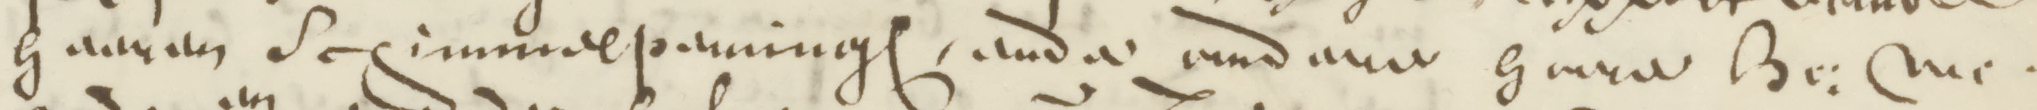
heeren Schimmelpenningh, ende andere hare Ho:Mo:
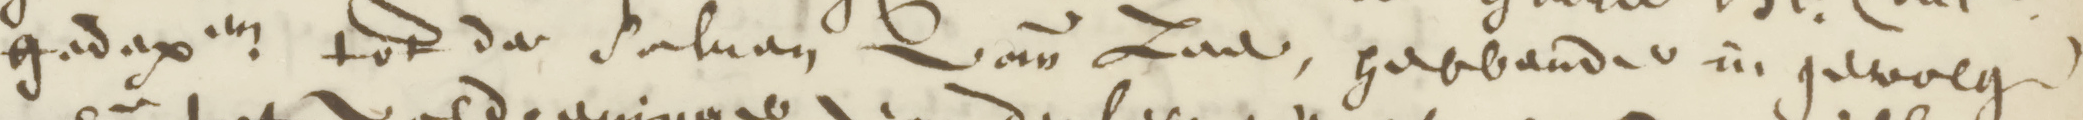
gedepen. tot de saken van Zee, hebbende in gevolge
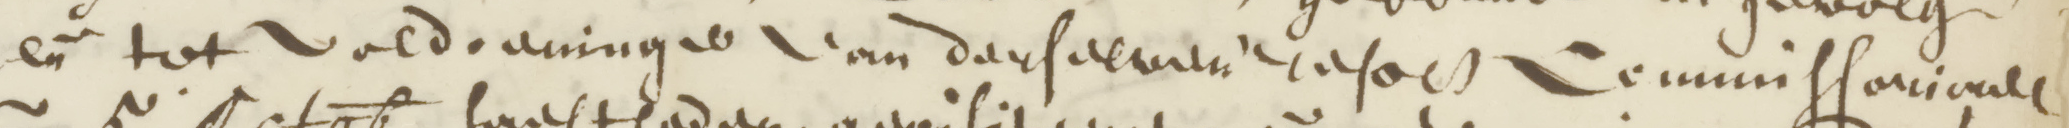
en tot voldoeninge van derselven resol Commissoriael
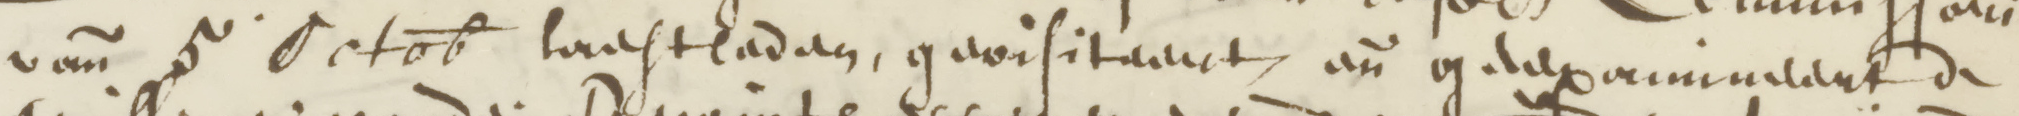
van 5. Octob laestleden, gevisiteert en geexamineert de
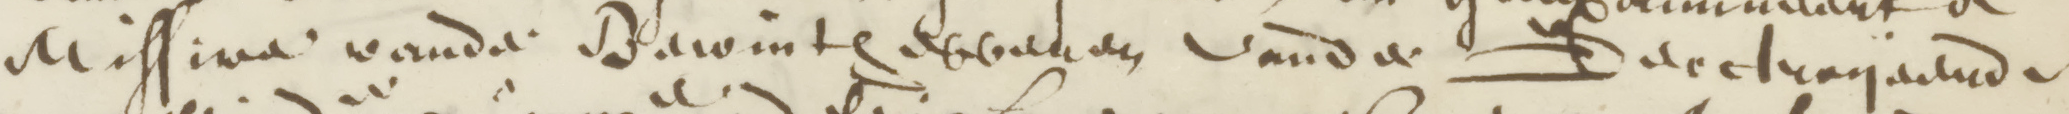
Missive vande Bewinthebberen vande Geoctroijeerde
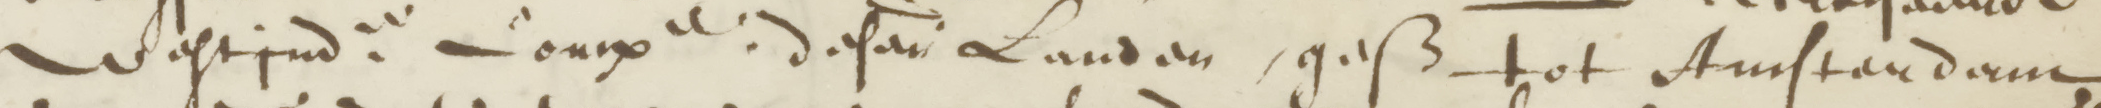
Westinde. Compe. deser Landen, ges tot Amsterdam,
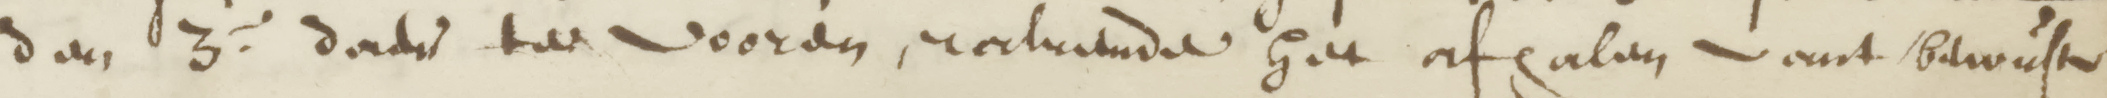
den 3e. daer te vooren, rakende het afhalen vant bewuste
